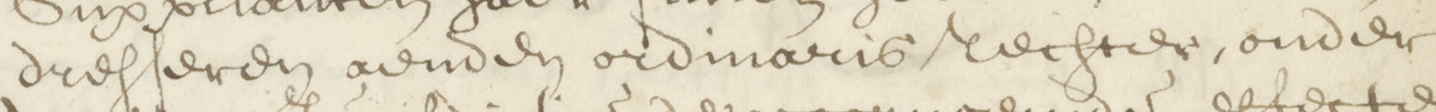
dresseren aenden ordinaris Rechter, onder
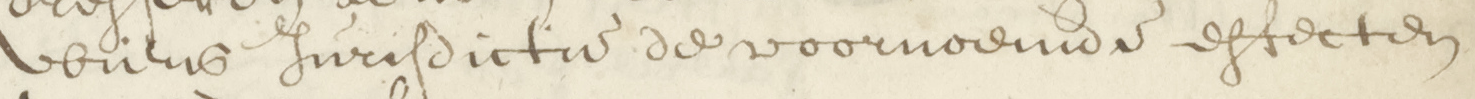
wiens Jurisdictie de voornoemde effecten
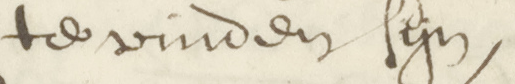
te vinden sijn.
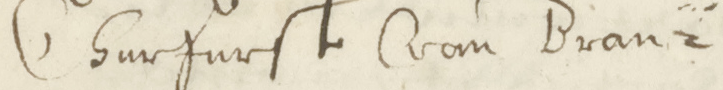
Churfurst van Bran„
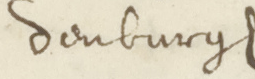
denburgh
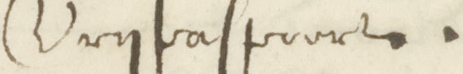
Vry paspoort.
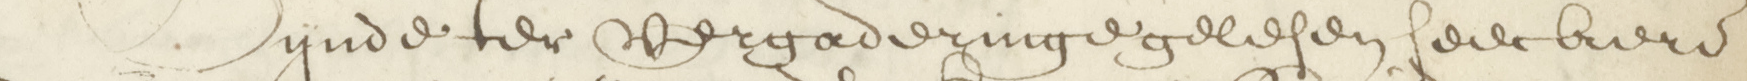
Sijnde ter Vergaderinge gelesen seeckere
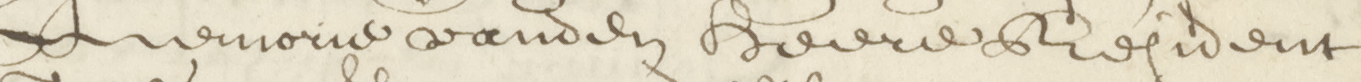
Memorie vanden Heere Resident
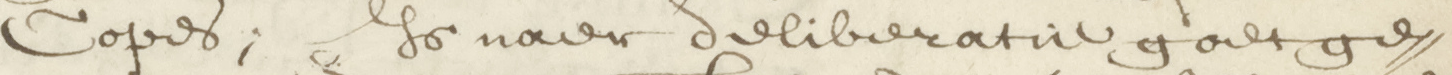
Copes; Is naer deliberatie goetge„
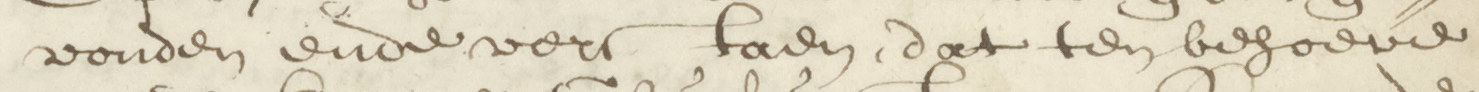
vonden ende verstaen, dat ten behoeve
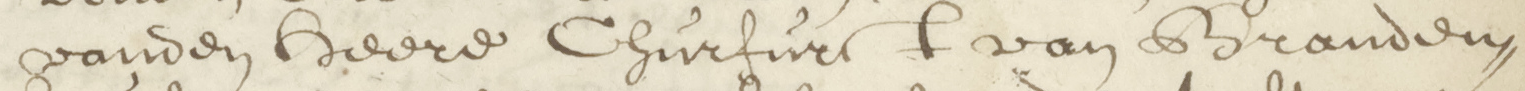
vanden Heere Churfurst van Branden„
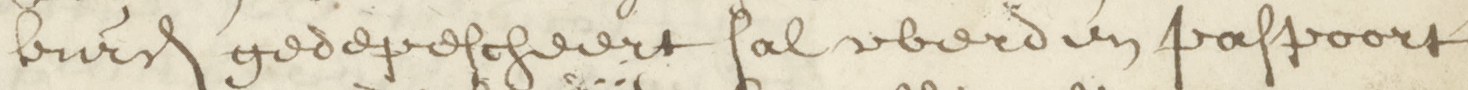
burch gedepescheert sal werden paspoort
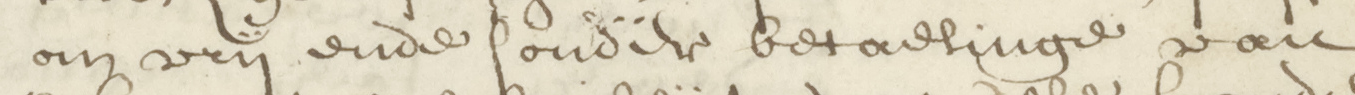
om vrij ende sonder betaelinge van
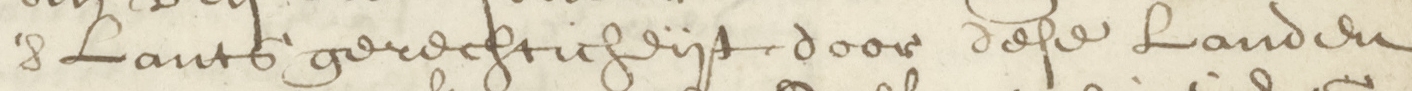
‛s Lants gerechticheijt door dese Landen
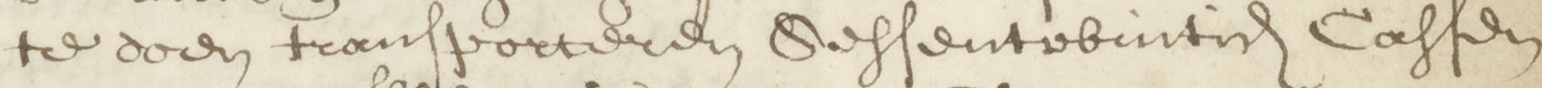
te doen transporteren Sessentwintich Cassen
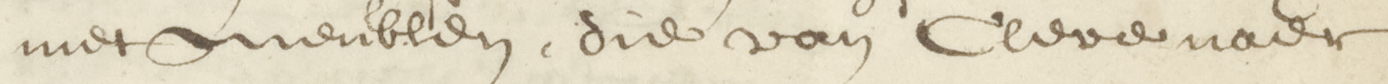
met Meublen, die van Cleve naer
